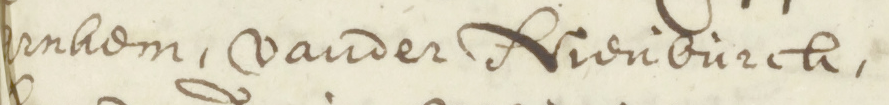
Arnhem, vander Nieuburch,
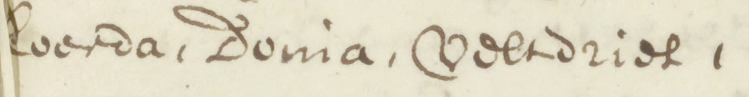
Roorda, Donia, Veltdriel.
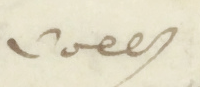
Coll
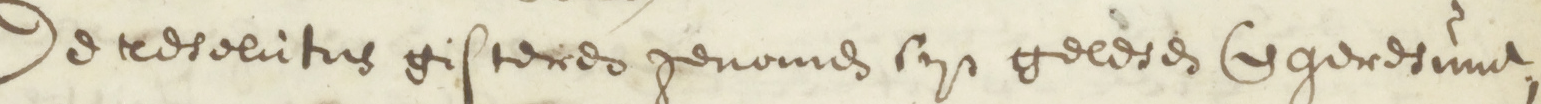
De resolutien gisteren genomen syn gelesen & geresumt.
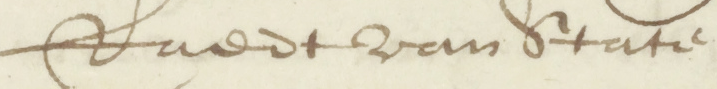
Raedt van State
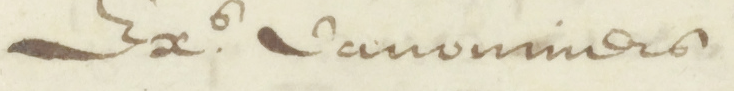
Exs. Canonniers
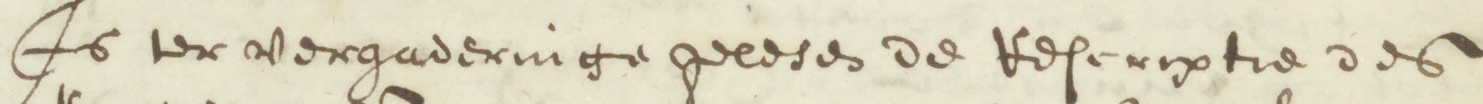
Is ter vergaderinge gelesen de Rescriptie des
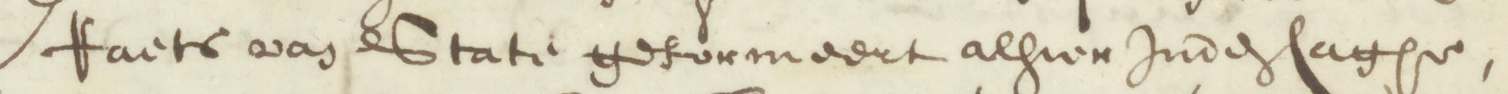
Raets van State geformeert alhier Inden Haghe,
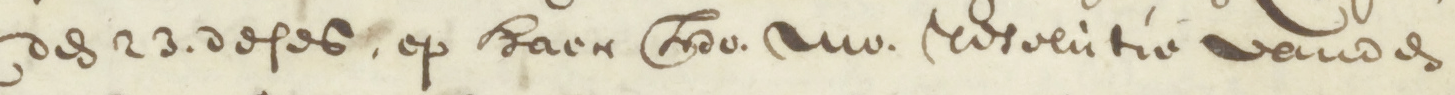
den 23. deses, op Haer Ho.Mo. resolutie vanden
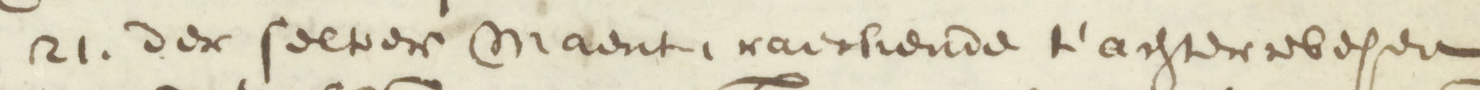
21. der selver maent, raeckende t' achterwesen
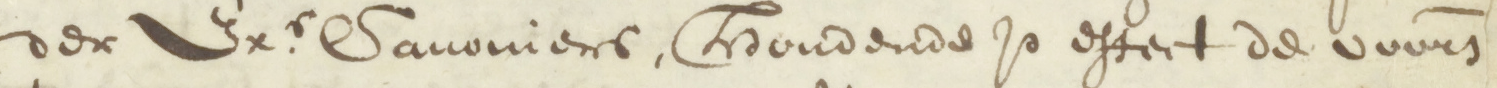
der Exs. Canoniers, Houdende In effect de voorn
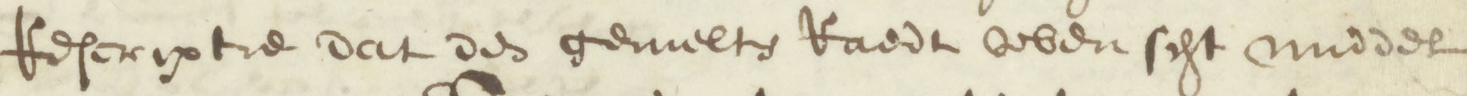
Rescriptie dat den gemelten Raedt wenscht middel
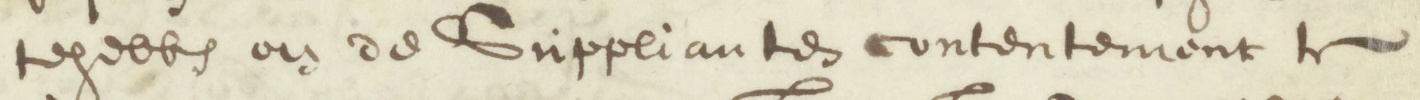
te hebben om de Supplianten contentement te
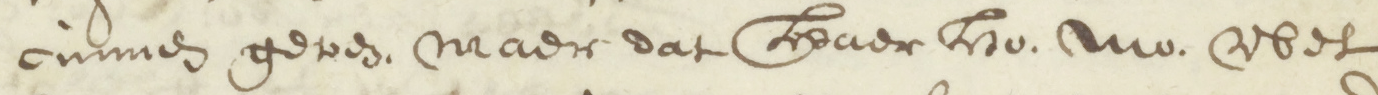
cunnen geven, maer dat Haer Ho.Mo. wel
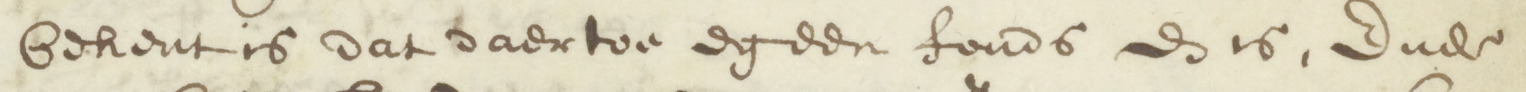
bekent is dat daertoe egeen fonds en is, Ende
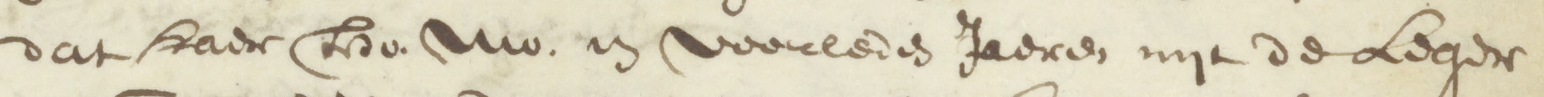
dat Haer Ho.Mo. in voorleden Jaeren, uijt de Leger
